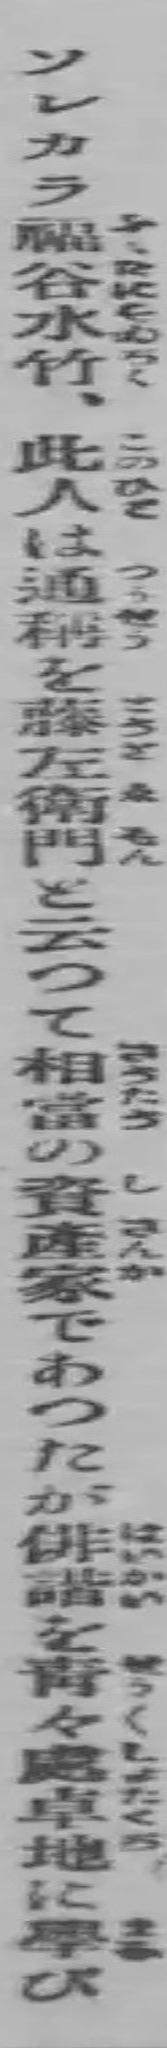福谷水竹ソレカラ福谷水竹、此人は通称を藤左衛門と云つて相当の資産家であつたが俳諧を青々処卓地に学び
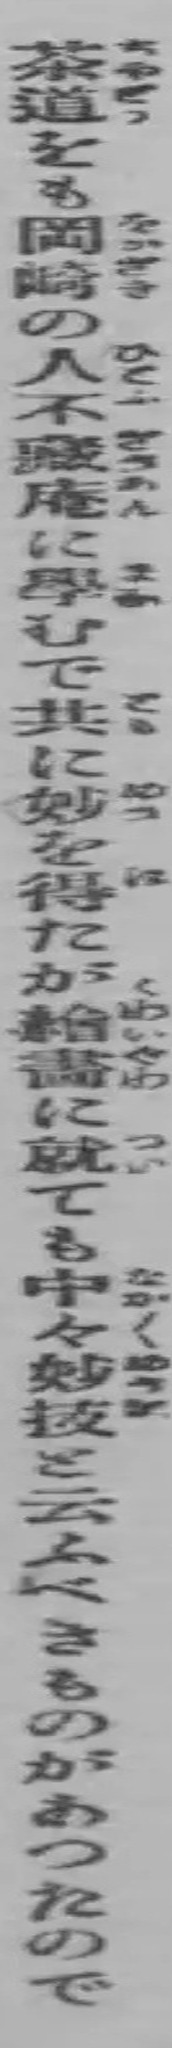茶道をも岡崎の人不蔵庵に学むで共に妙を得たが絵画に就ても中々妙抜と云ふべきものがあつたので
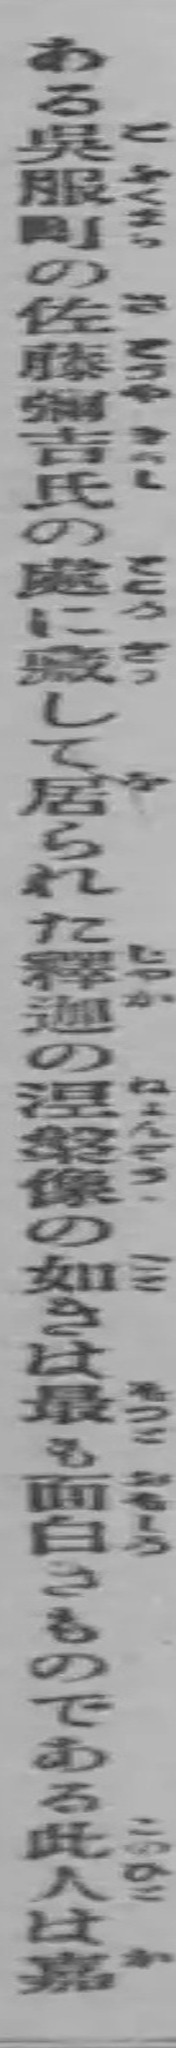ある呉服町の佐藤弥吉氏の処に蔵して居られた釈迦の涅槃像の如きは最も面白きものである此人は嘉

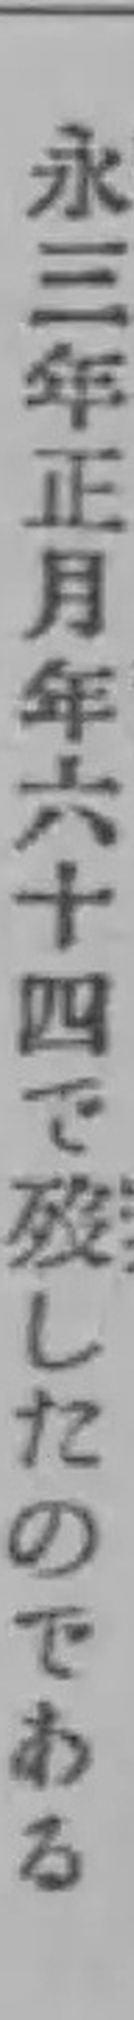永三年正月年六十四で歿したのである
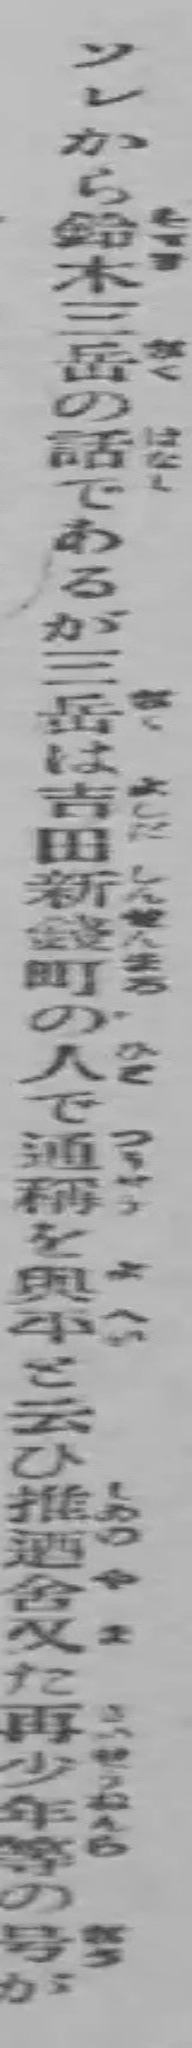鈴木三岳ソレから鈴木三岳の話であるが三岳は吉田新銭町の人で通称を与平と云ひ推迺舎又た再少年等の号が
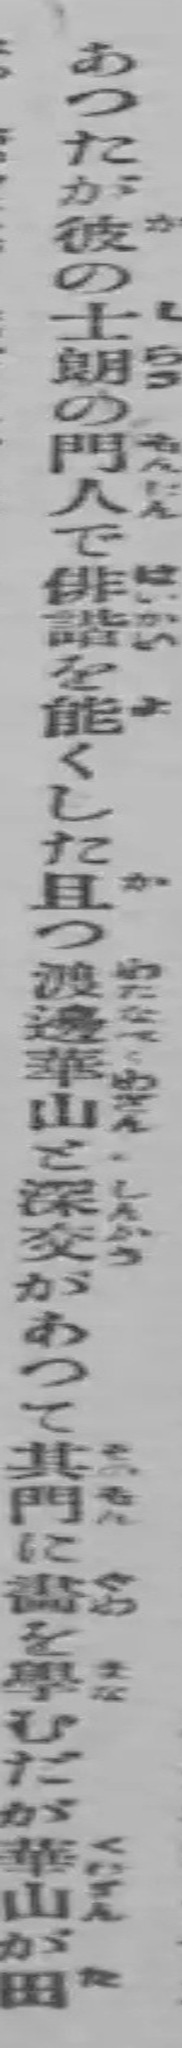あつたが彼の士朗の門人で俳諧を能くした且つ渡辺崋山と深交があつて其門に画を学むだが崋山が田
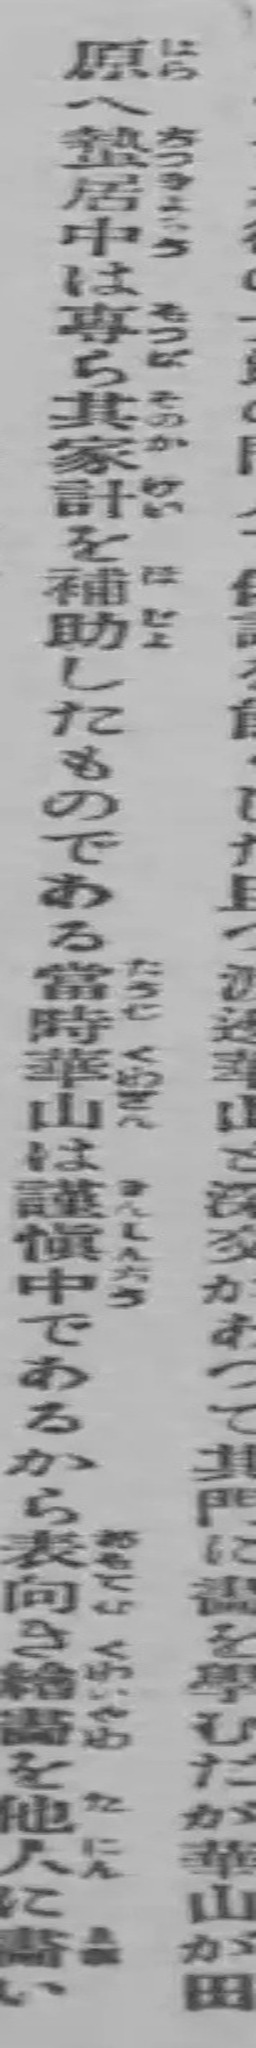原へ蟄居中は専ら其家計を補助したものである当時崋山は謹慎中であるから表向き絵画を他人に画い
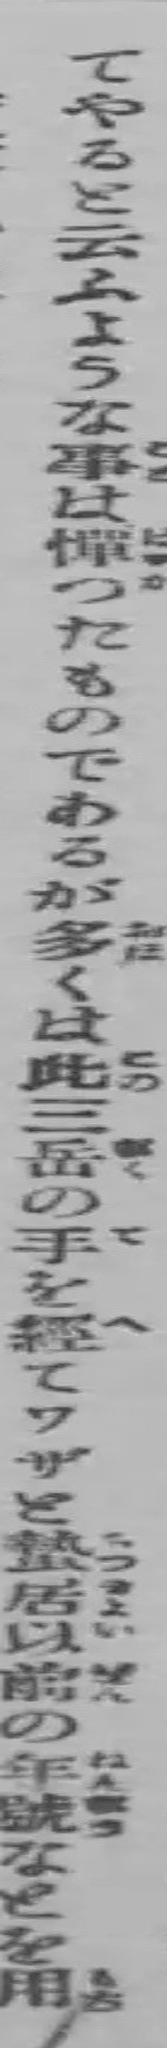てやると云ふような事は憚つたものであるが多くは此三岳の手を経てワザと蟄居以前の年号なとを用
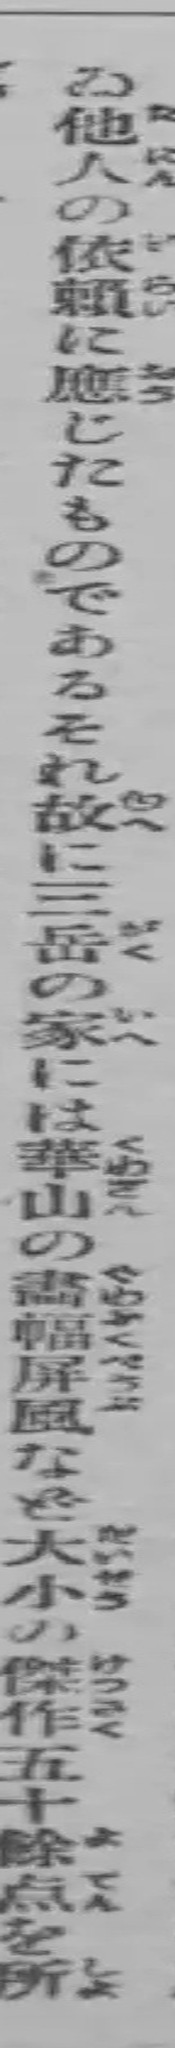ゐ他人の依頼に応じたものであるそれ故に三岳の家には崋山の画幅屏風など大小の傑作五十余点を所
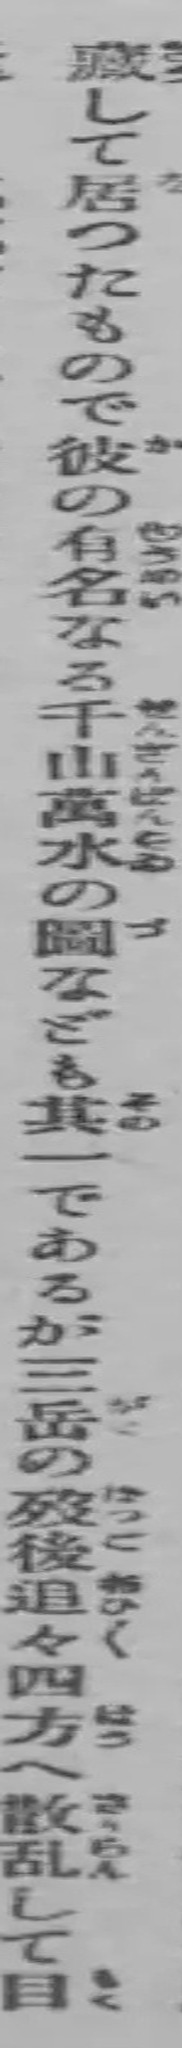蔵して居つたもので彼の有名なる千山万水の図なども其一であるが三岳の歿後追々四方へ散乱して目
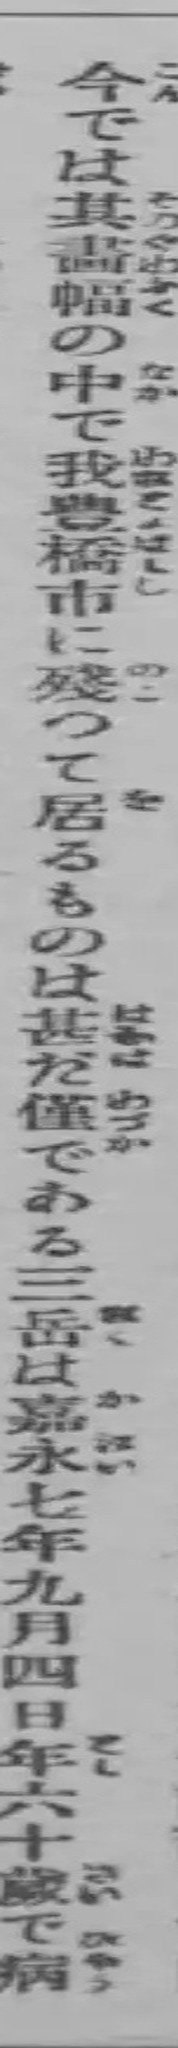今では其画幅の中で我豊橋市に残つて居るものは甚だ僅である三岳は嘉永七年九月四日年六十歳で病
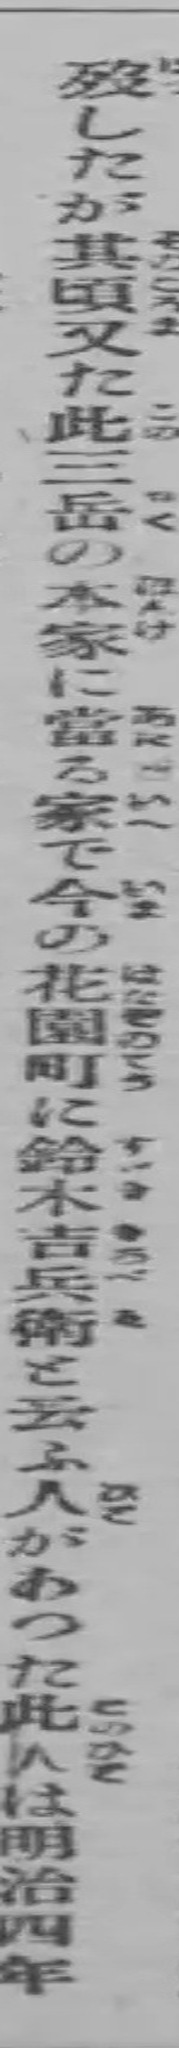鈴木吉兵衛歿したが其頃又た此三岳の本家に当る家で今の花園町に鈴木吉兵衛と云ふ人があつた此人は明治四年
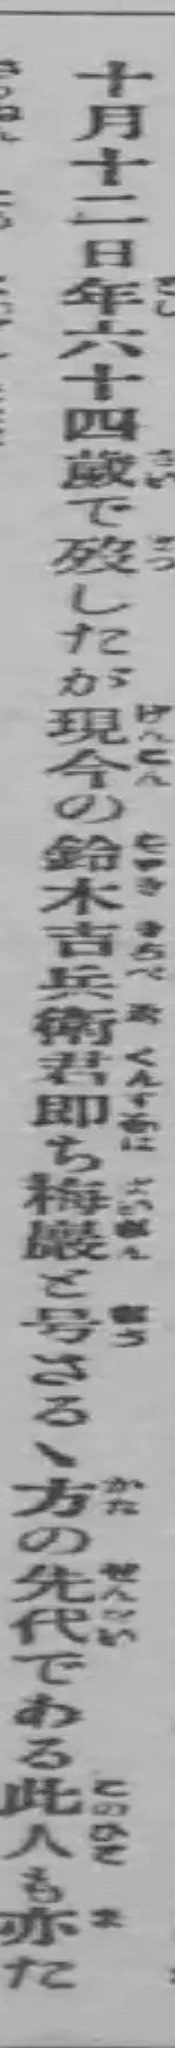十月十二日年六十四歳で歿したが現今の鈴木吉兵衛君即ち梅厳と号さるゝ方の先代である此人も亦た
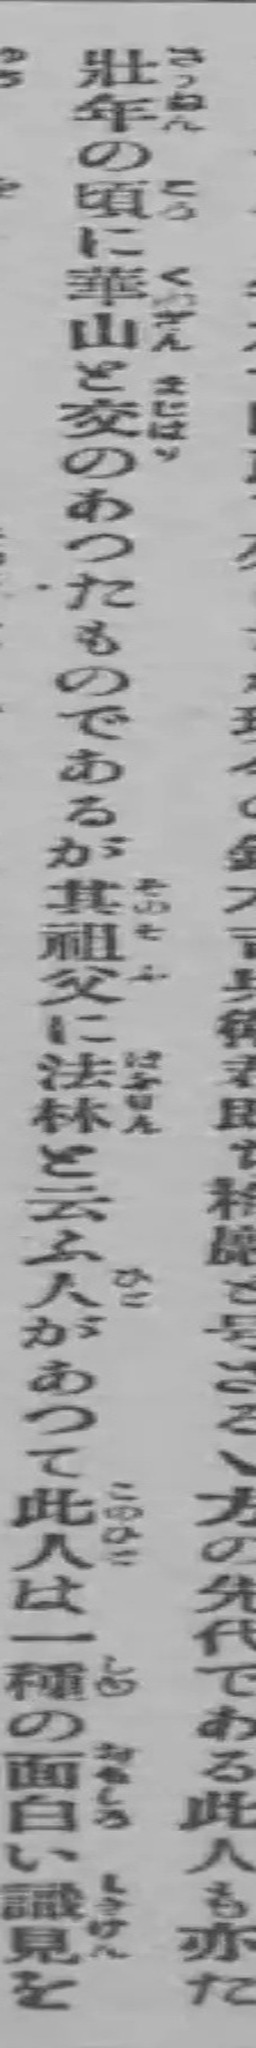壮年の頃に崋山と交のあつたものであるが其祖父に法林と云ふ人があつて此人は一種の面白い識見を
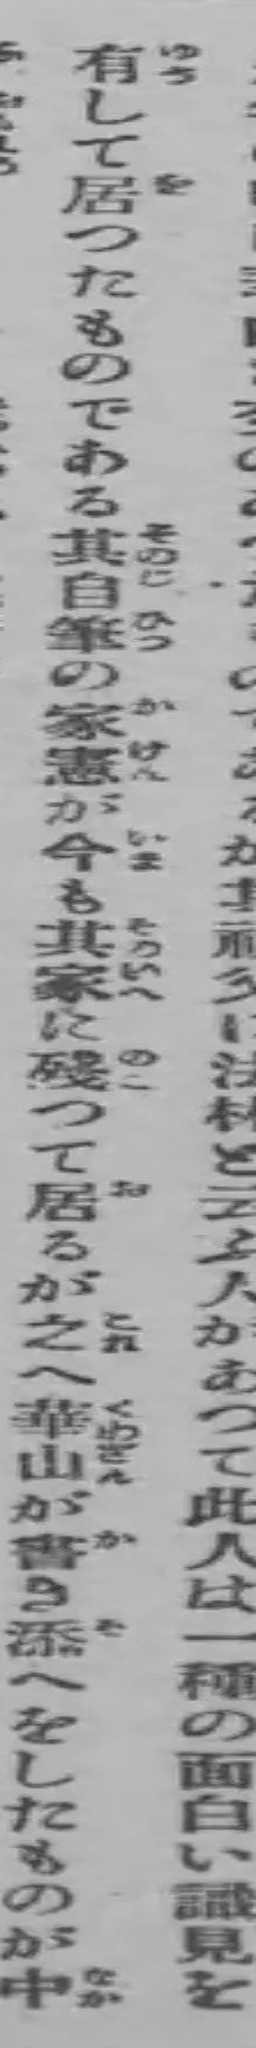有して居つたものである其自筆の家憲が今も其家に残つて居るが之へ崋山が書き添へをしたものが中
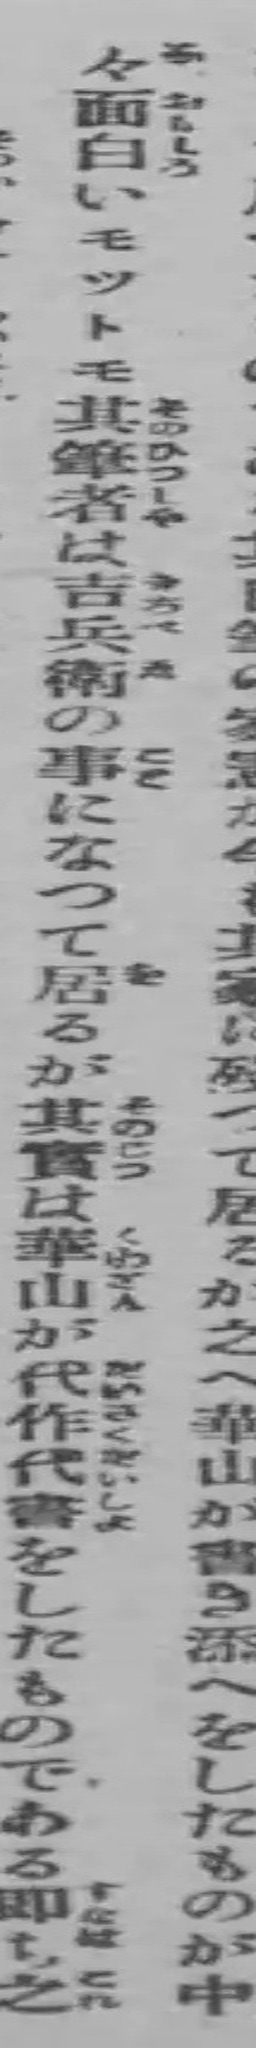中面白いモツトモ其筆者は吉兵衛の事になつて居るが其実は崋山が代作代書をしたものである即ち之
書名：豊橋市史談
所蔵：国立国会図書館 National Diet Library, JAPAN
